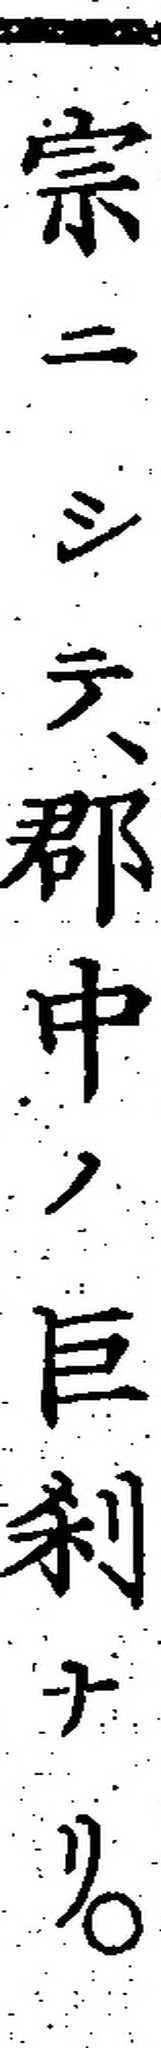宗ニシテ、郡中ノ巨刹ナリ。
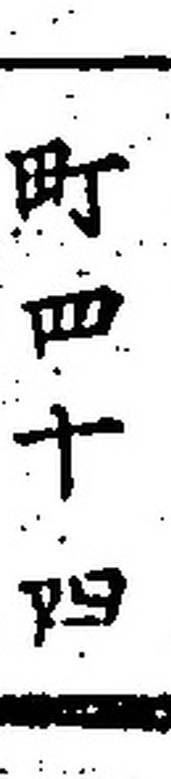町四十四
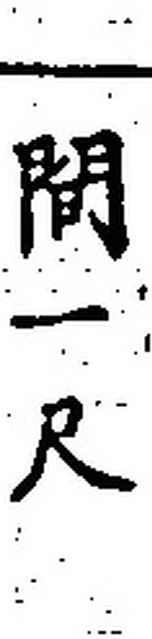間一尺
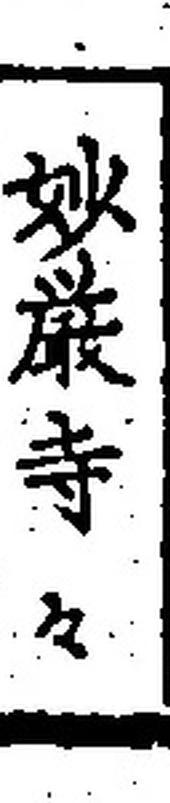妙厳寺々
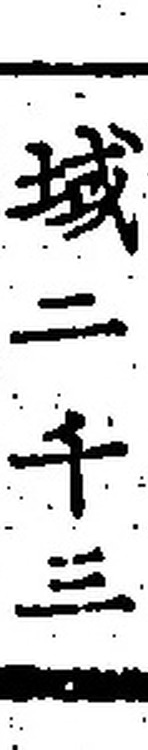域二千三
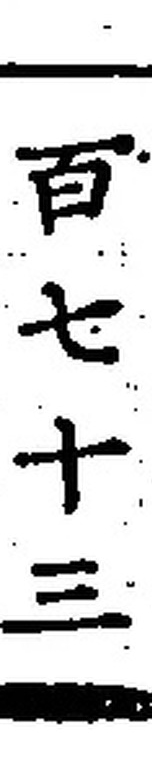百七十三
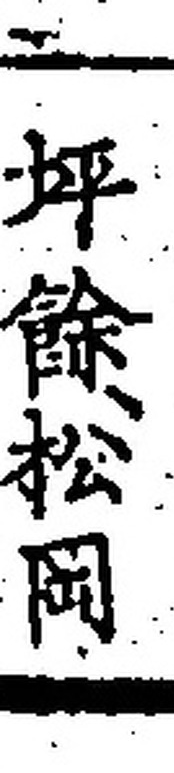坪余、松岡
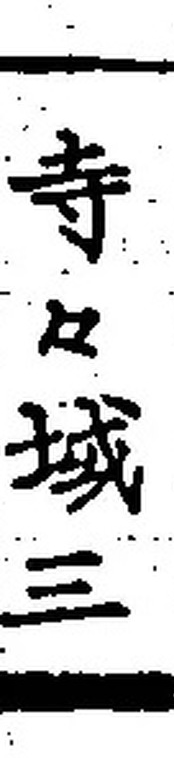寺々域三
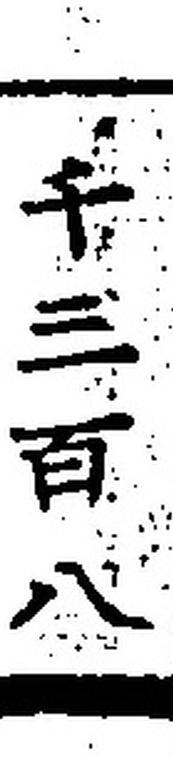千三百八
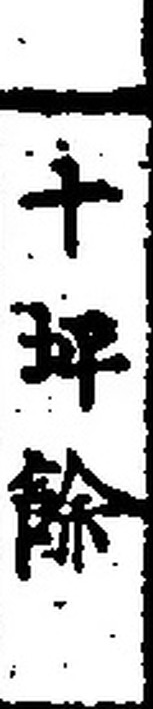十坪余
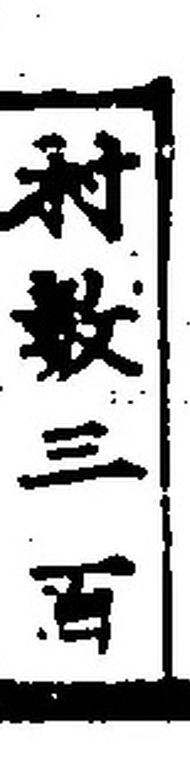村数三百
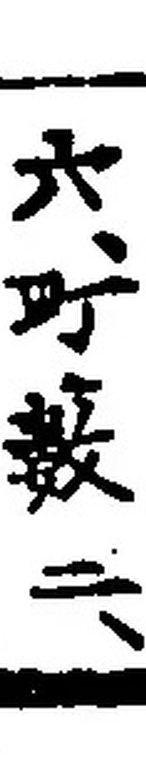六、町数二、
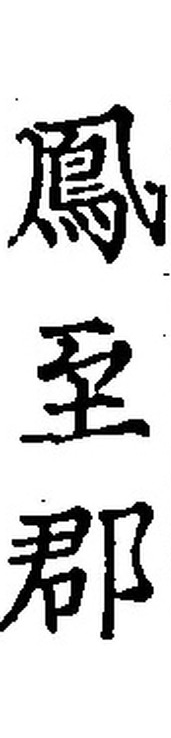鳳至郡
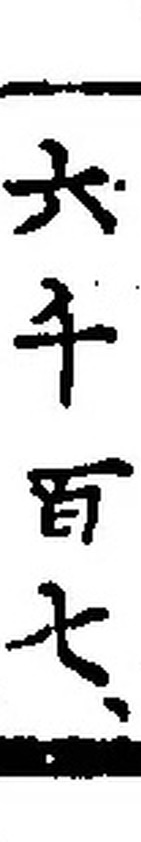六千百七、
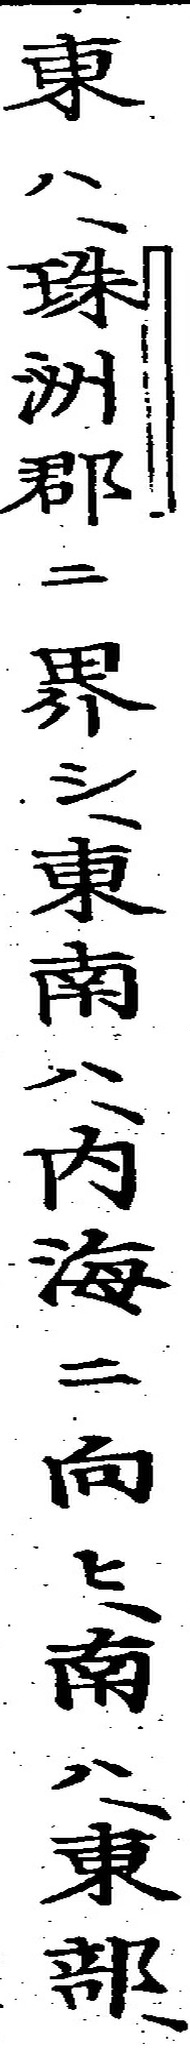東ハ、珠洲郡ニ界シ、東南ハ、内海ニ向ヒ、南ハ、東部、
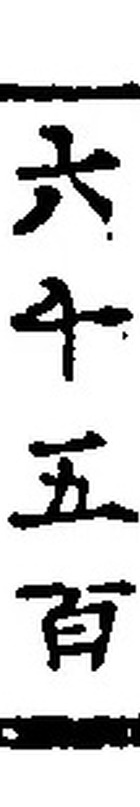六千五百
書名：能登地誌略
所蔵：国立国会図書館 National Diet Library, JAPAN
